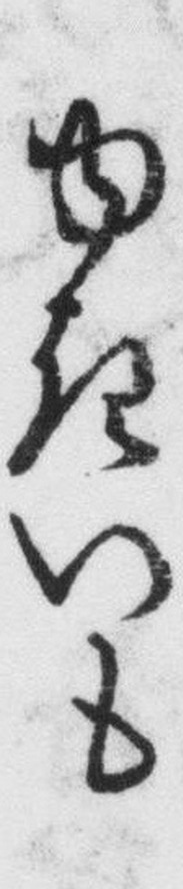ゆ起いも
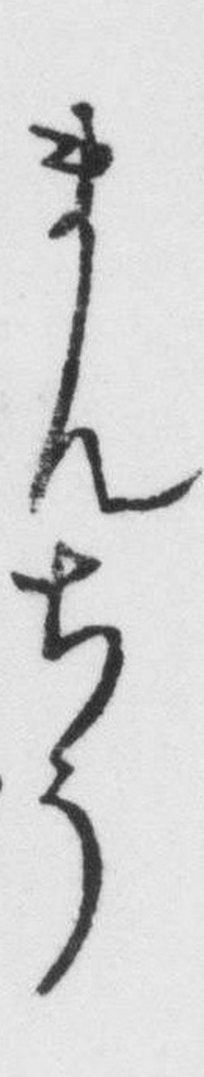まんちう
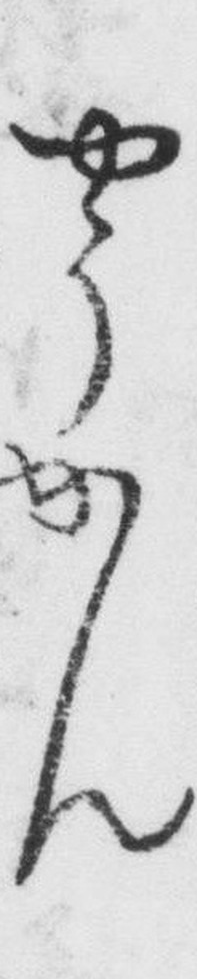やうかん
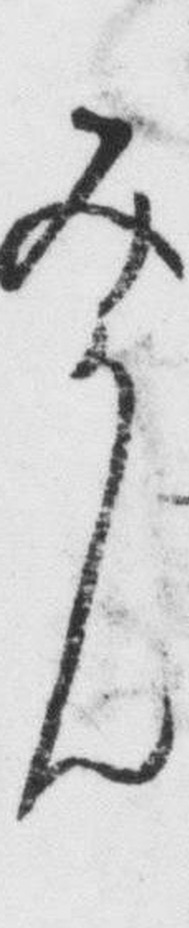みかん
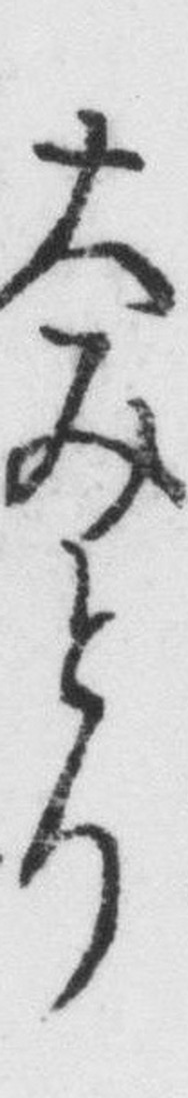大みとり
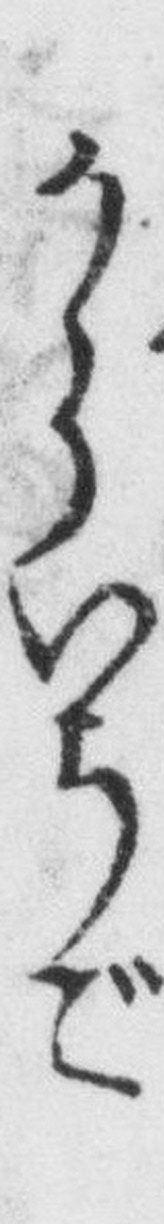うらいちご
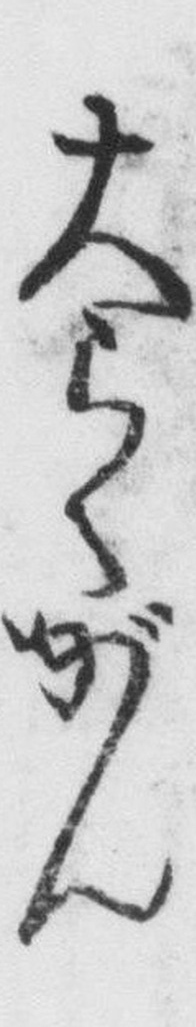大らくがん

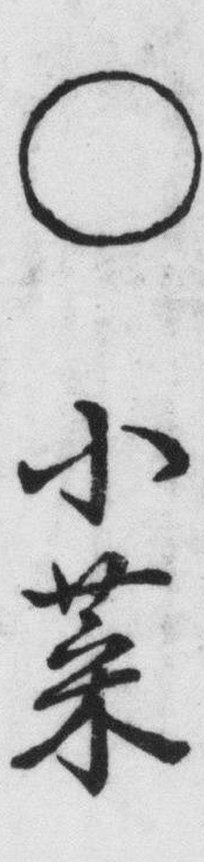〇小菜
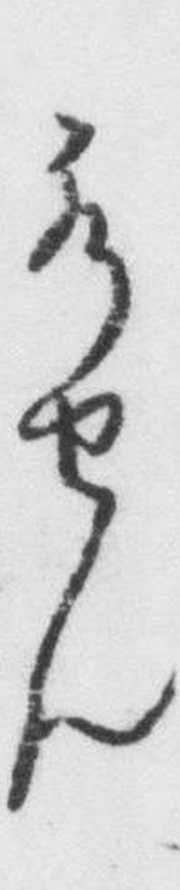水せん
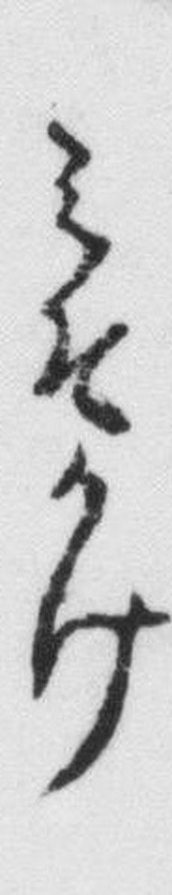みそかけ

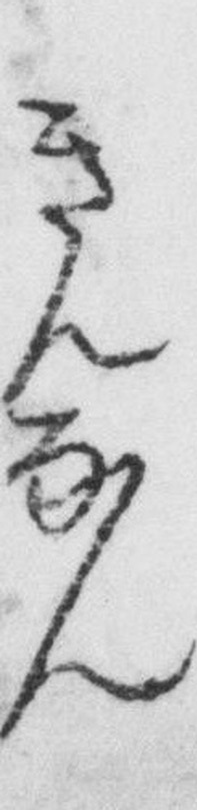きんなん
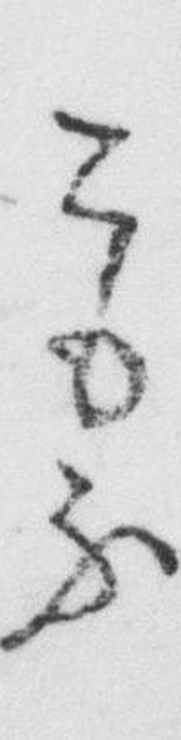こもふ
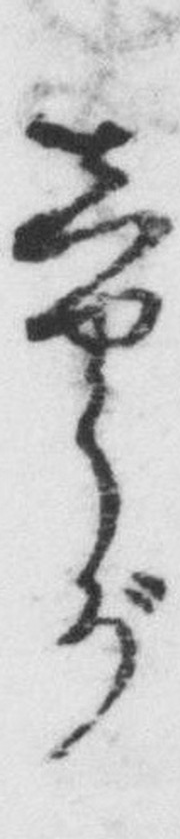志やうが
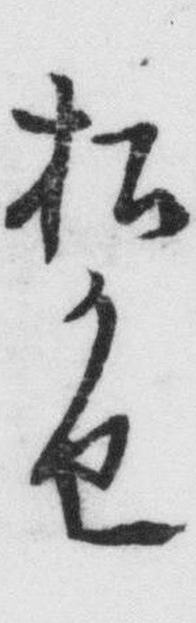松かせ
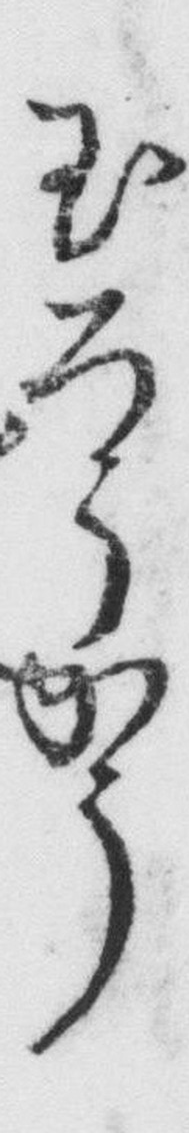飛ろうかう
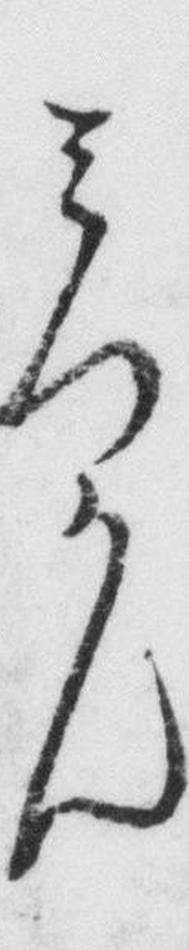みつかん
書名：普茶料理抄
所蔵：大阪府立大学学術情報センター 国文学研究資料館
